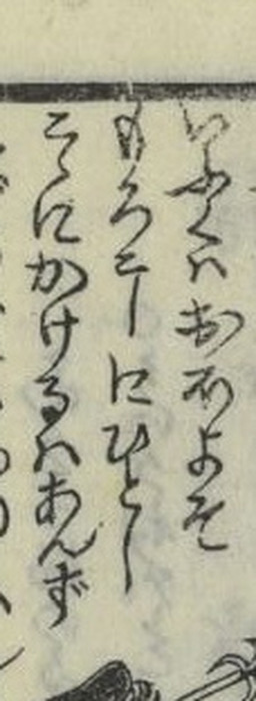もろこしにひとし
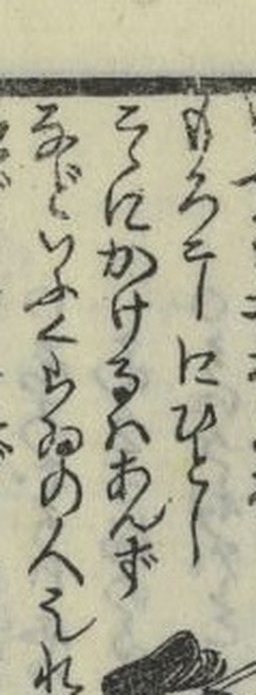こゝにかけるはあんず
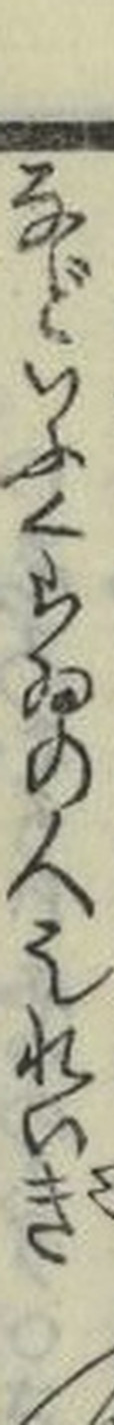などいふくらゐの人也れいき
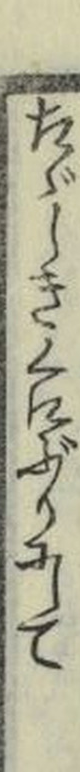たゞしきくにぶりにして
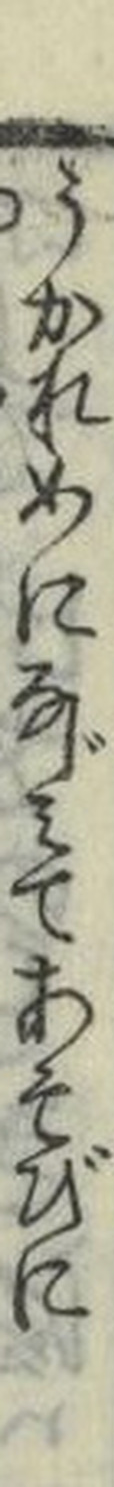うかれめになじみてあそびに
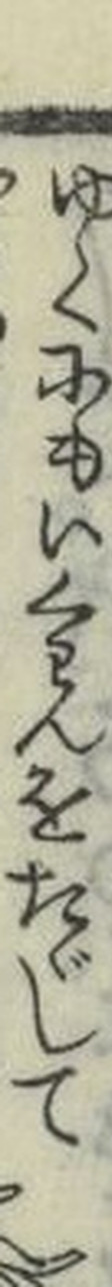ゆくにもいくわんをたゞして
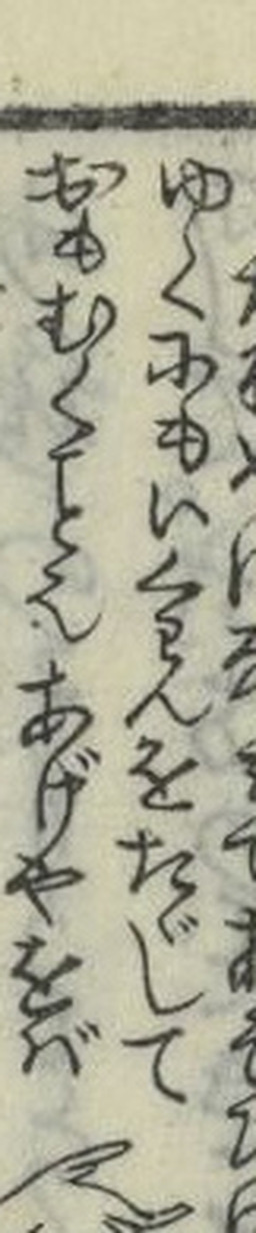おもむくこと也あげやをば
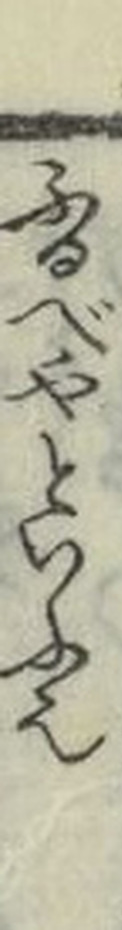ふるべやといふ也
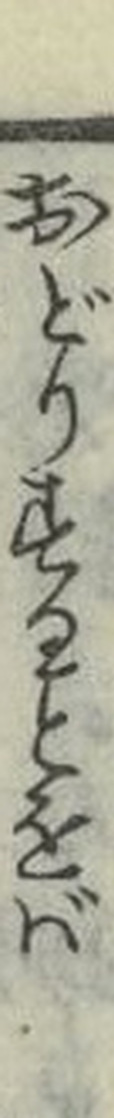おどりすることをば
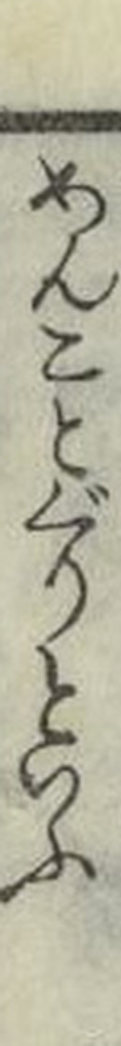めんことぐりといふ
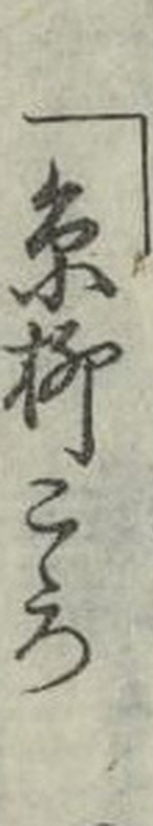〽糸柳こゝろ
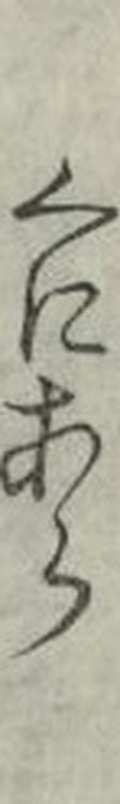くにあら
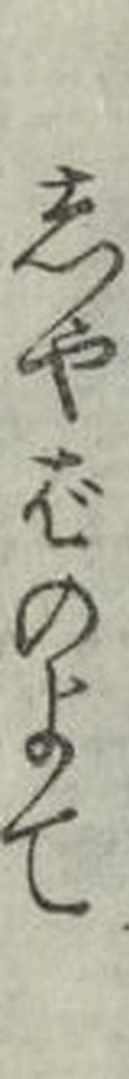しやばのよて
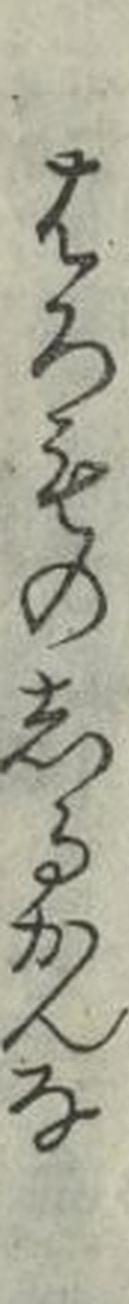はろものしるかんな
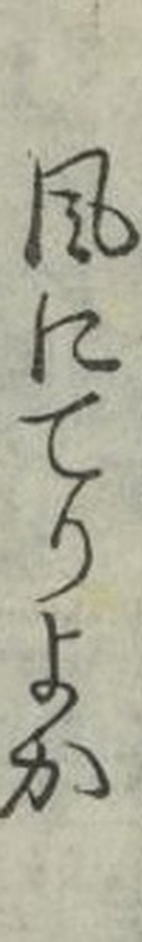風にてりよか
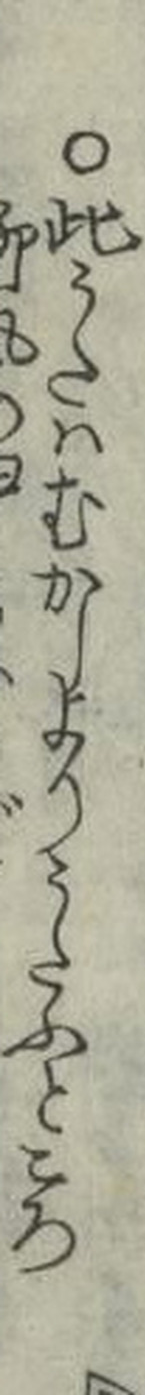○此うたはむかしよりうたふところ
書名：琉球奇譚
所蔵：University of the Ryukyus Library
